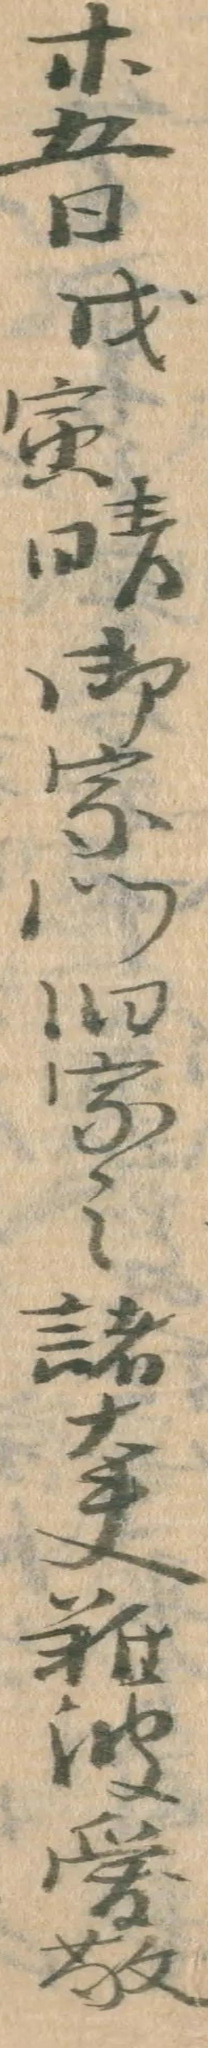廿五日戊寅晴、御家門旧家之諸大夫難波愛敬
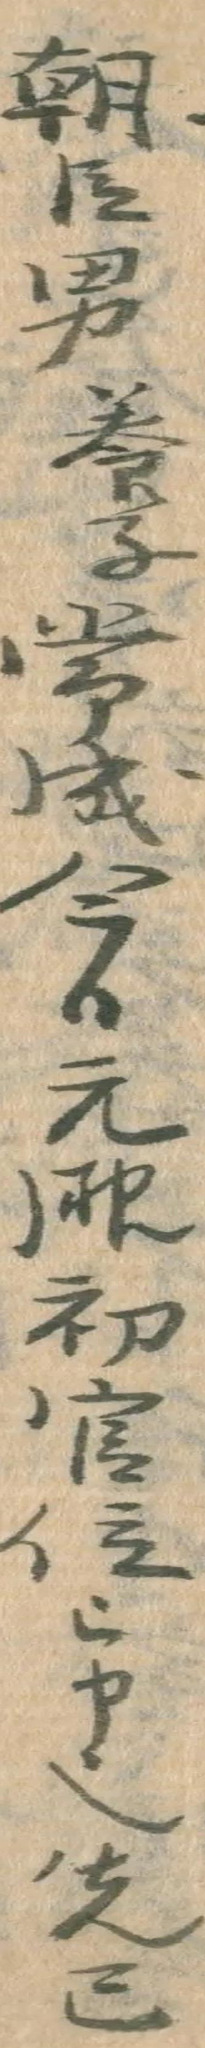朝臣男養子常威今日元服、初官位被申也、先巳
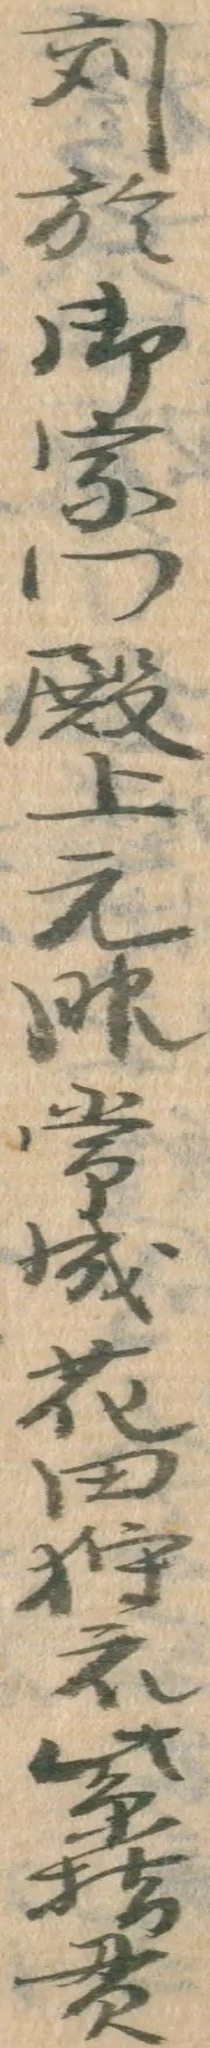刻於御家門殿上元服常成、花田狩衣・紫指貫、
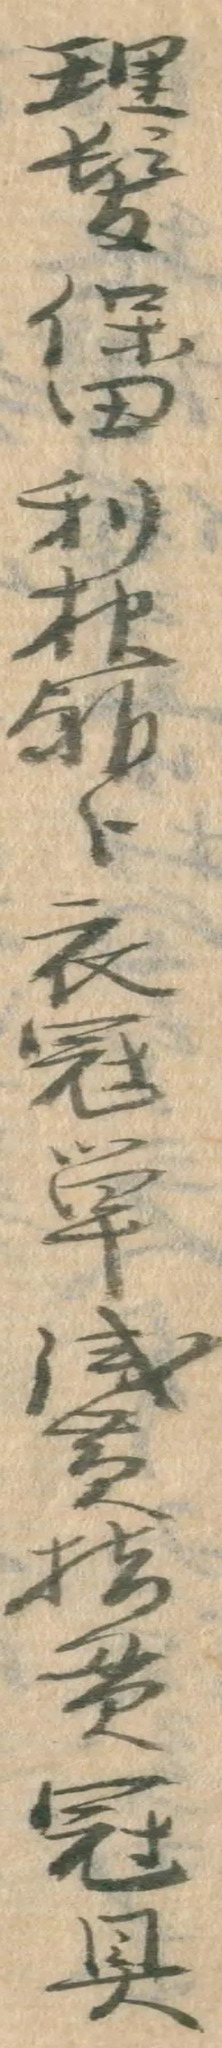理髪保田利領ト衣冠・単・浅黄指貫・冠具
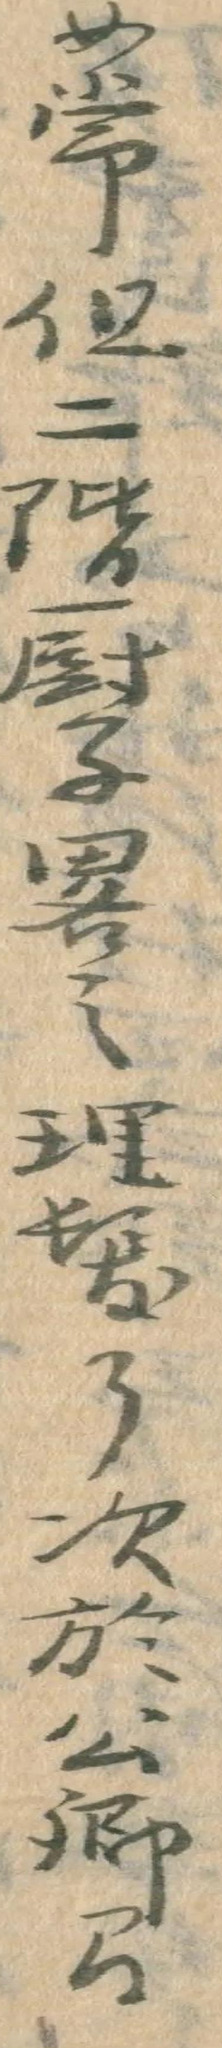如常、但二階厨子略之、理髪了、次於公卿間
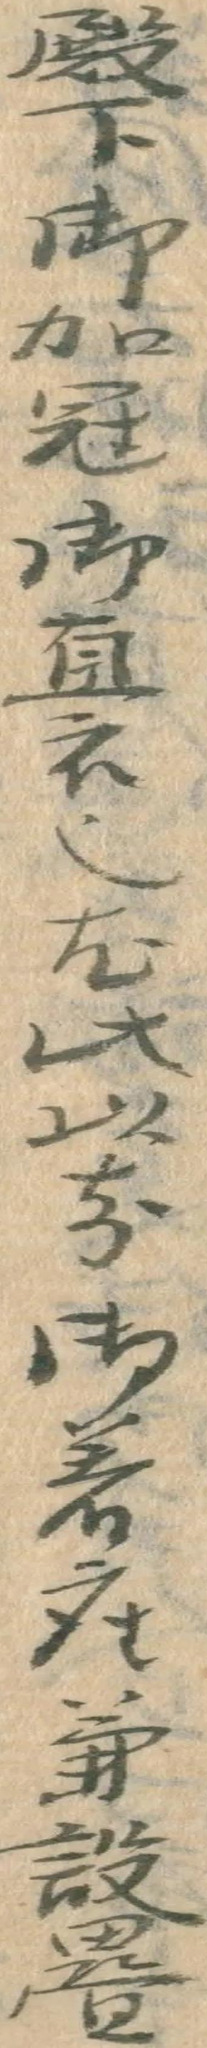殿下御加冠、御直衣也、尤此以前御着座、兼設置
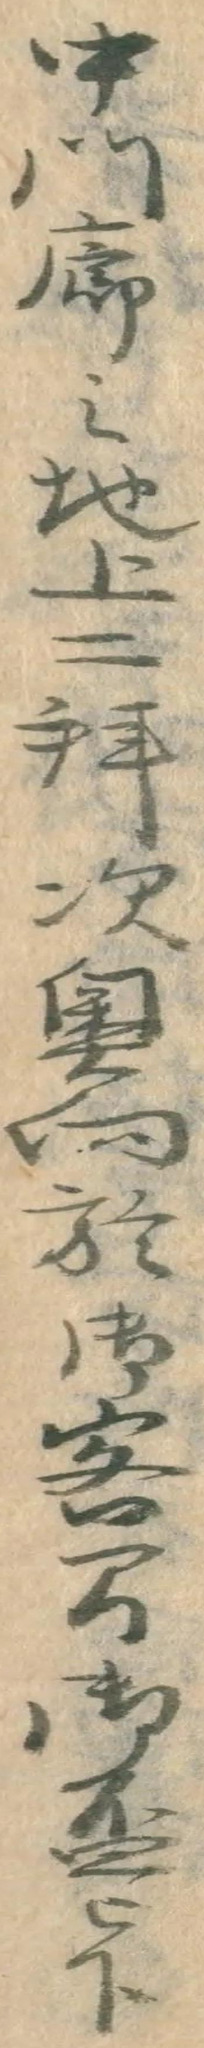中門廊之地上二拝、次奥向於御客間御盃被下

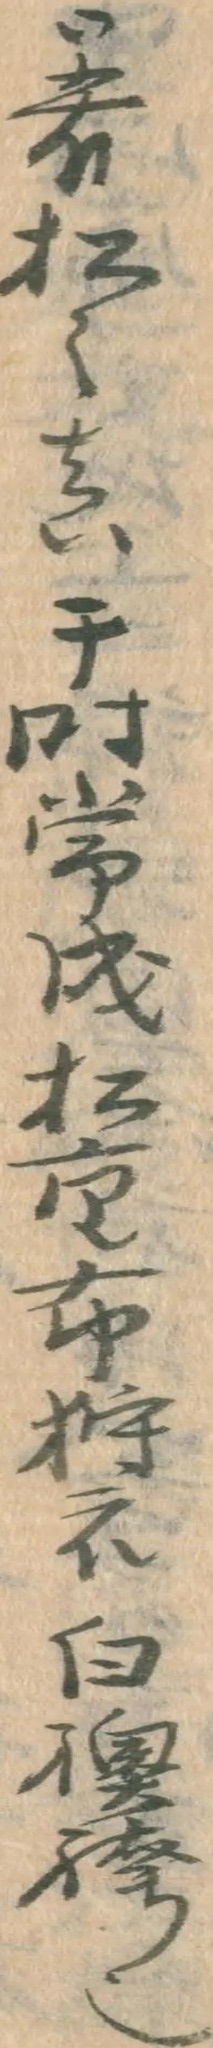御肴松之真、于時常成松重布狩衣・白襖・袴也、
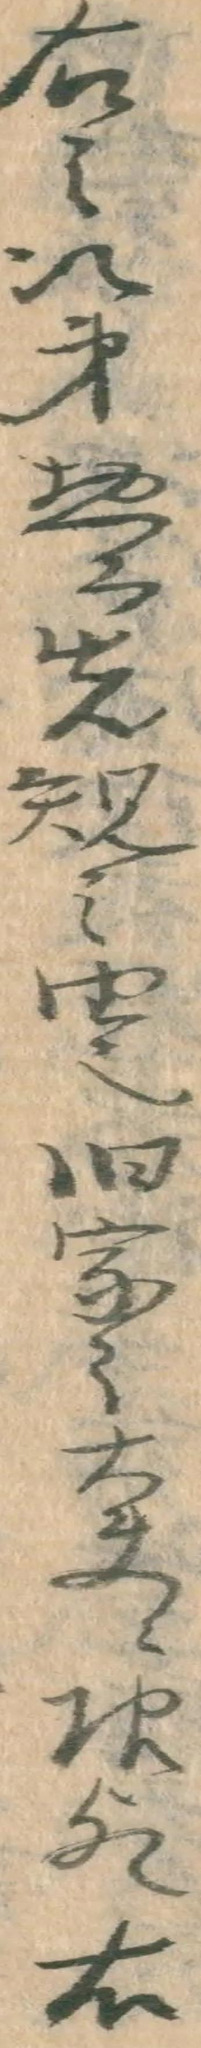右之次第、惣て先規之由也、旧家之大夫に限歟、右
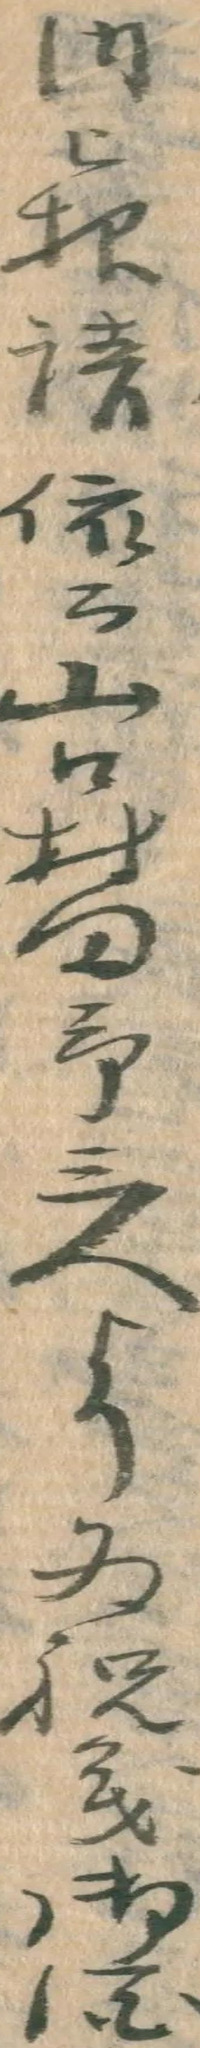内被招請、依而山口・村田・予三人より為祝義御酒
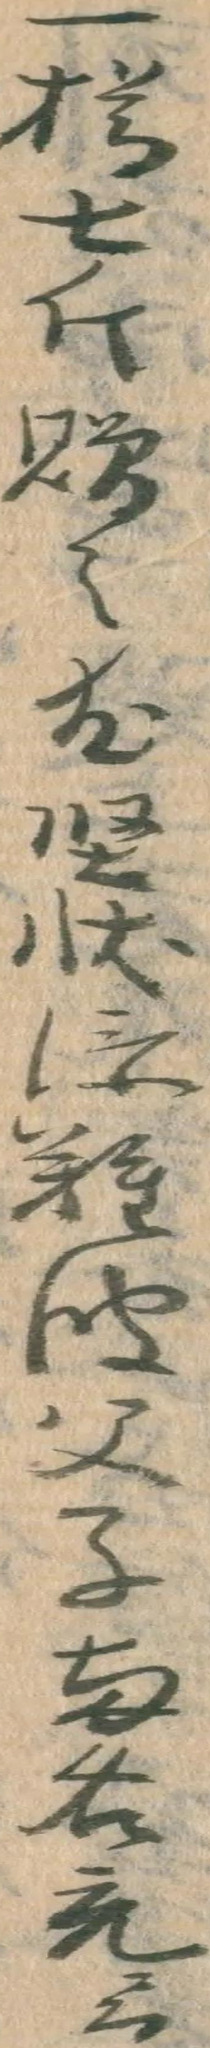一樽七斤贈之、尤堅状添、難波父子両名元ニ而
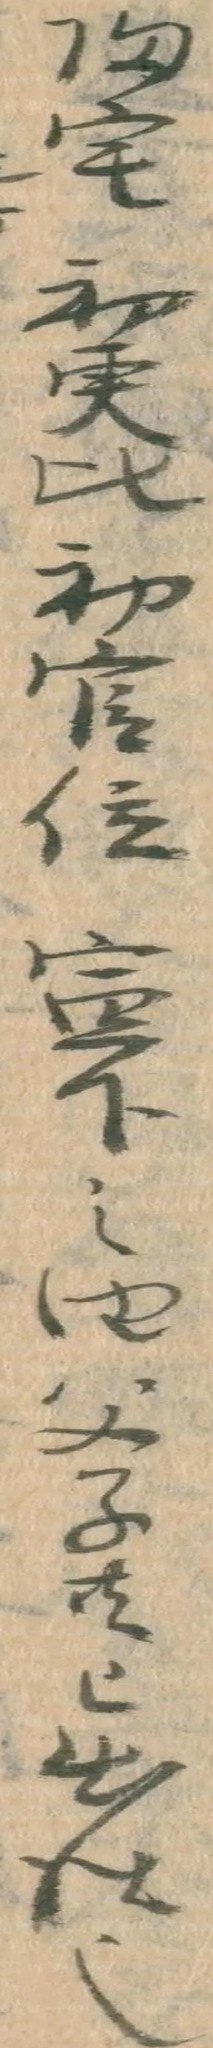帰宅、初更比初官位宣下之由、父子共被出仕也、
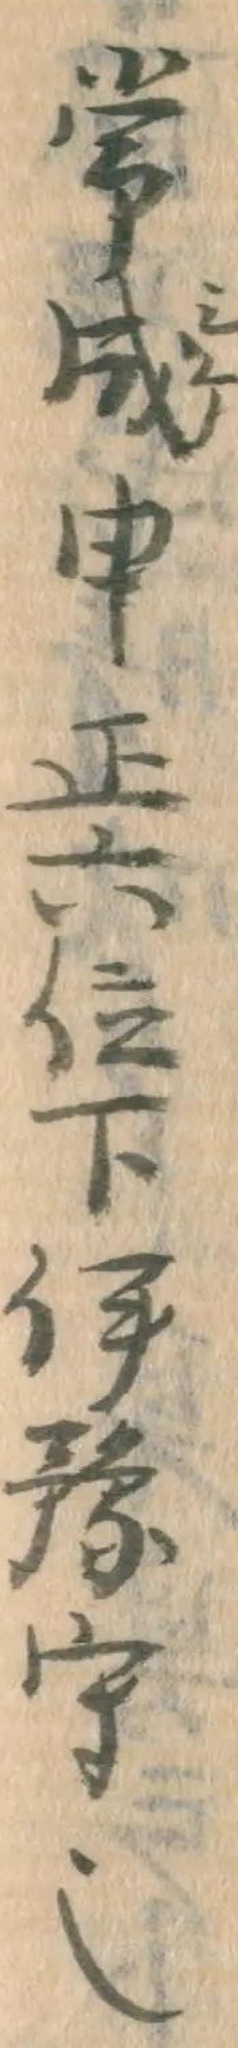常成申正六位下伊豫守也、
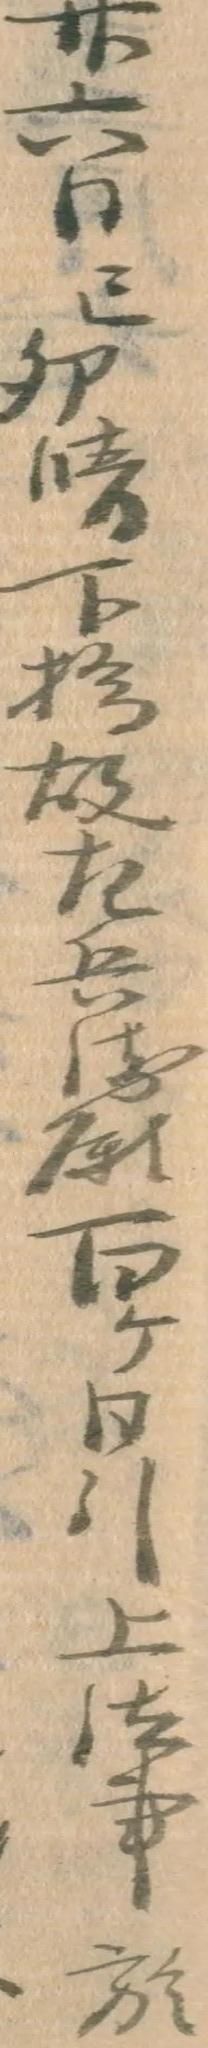廿六日己卯晴、下橋故左兵衛尉百ケ日引上法事、於
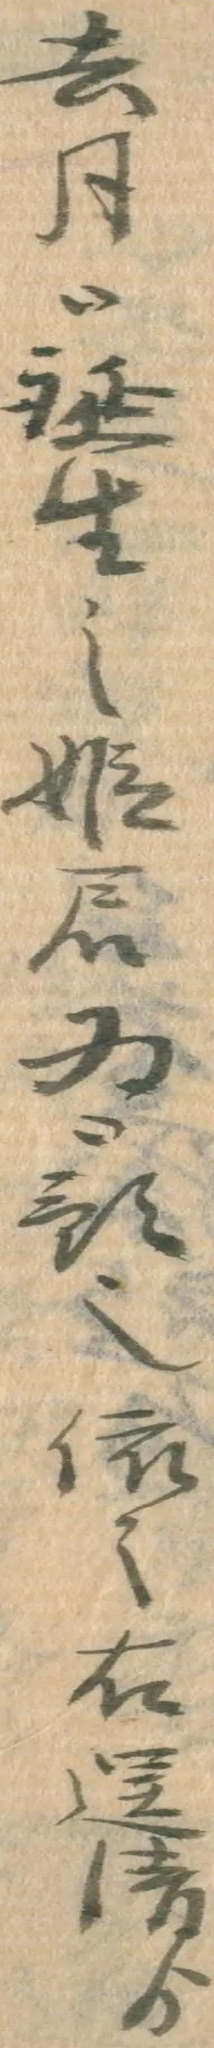去月御誕生之姫君為御預也、依之右逞清ゟ
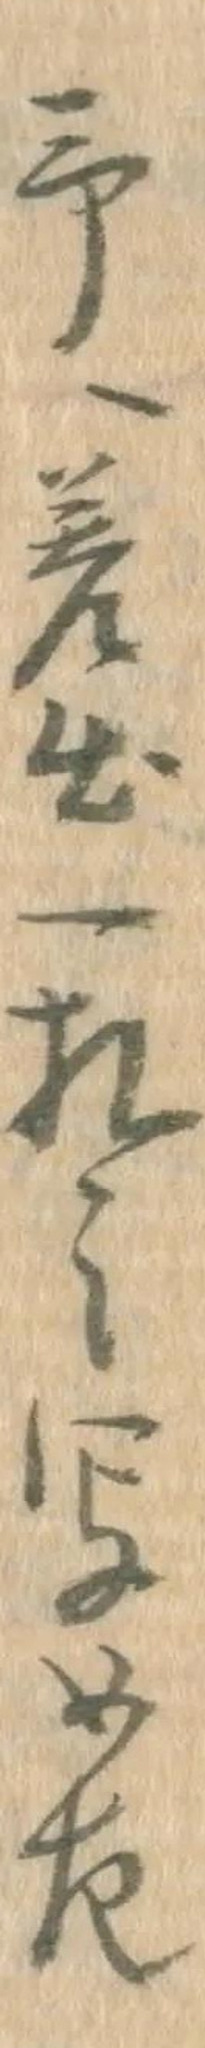予へ差出一札之写、如左
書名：賀茂社記録. 第63冊
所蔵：国立国会図書館 National Diet Library, JAPAN
